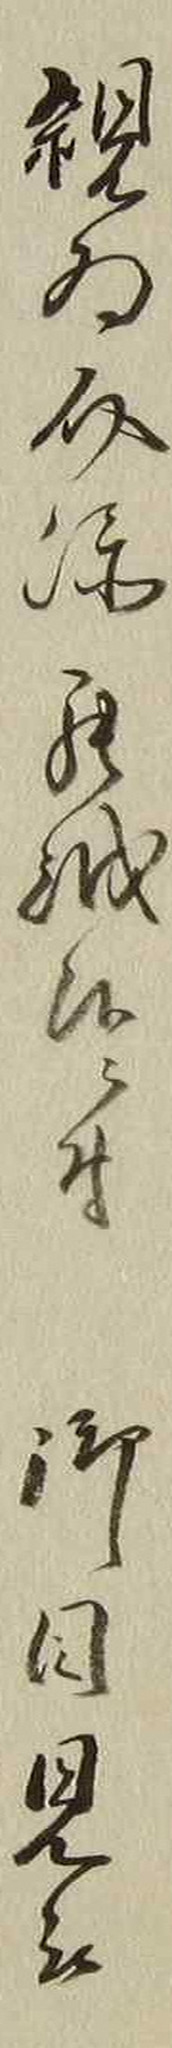親為介添罷越候ニ付御目見被
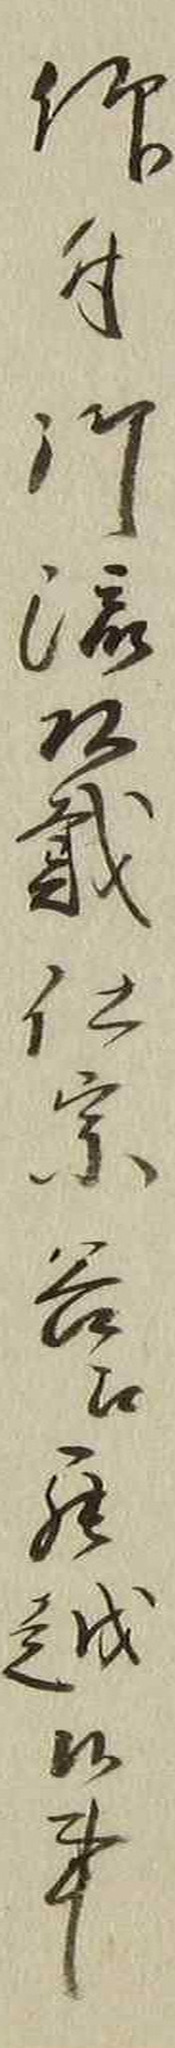仰付御流頭載仕宗谷江罷越候事
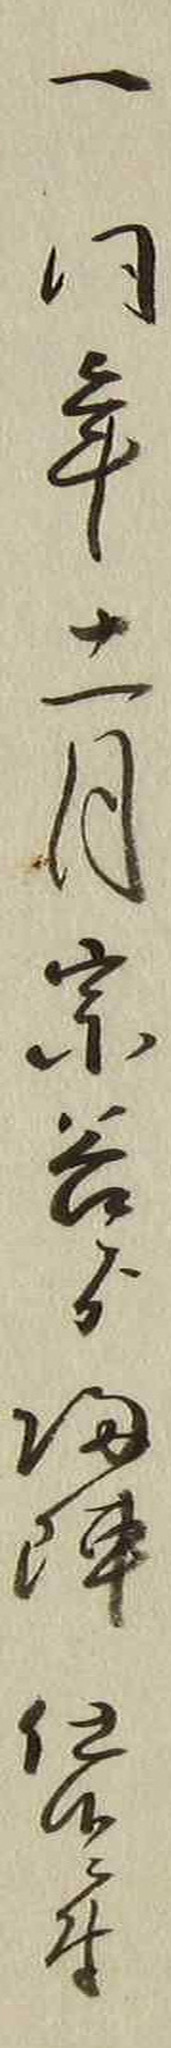一同年十一月宗谷ゟ帰陣仕候ニ付
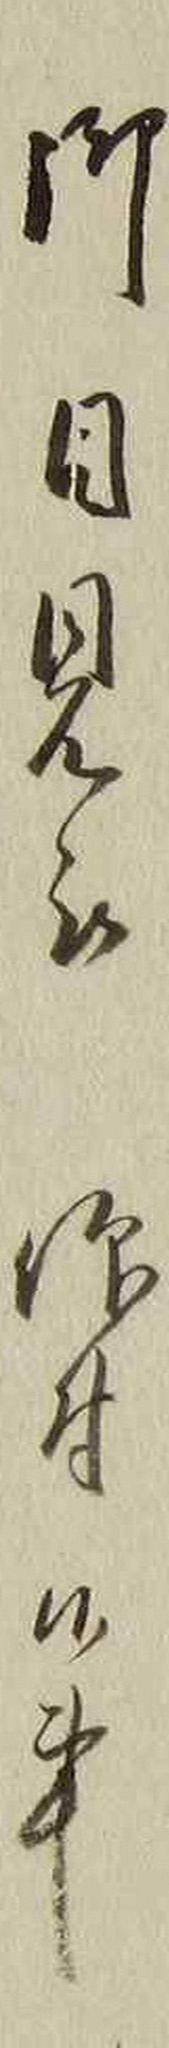御目見被仰付候事
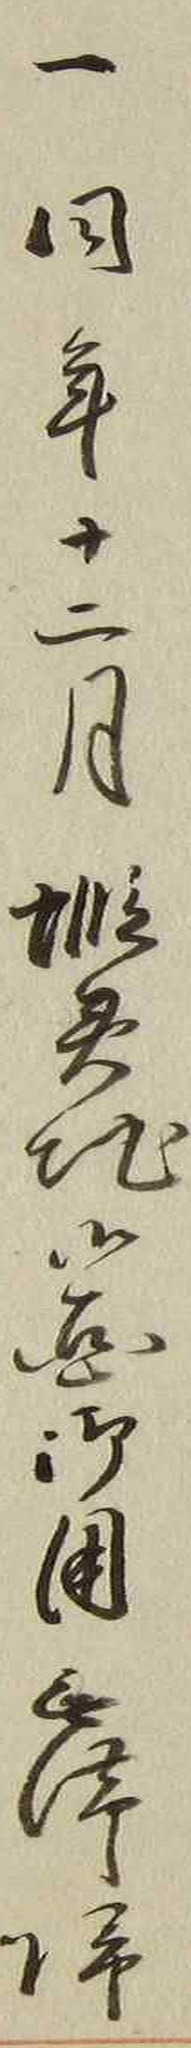一同年十二月蝦夷地御固御用無滞帰
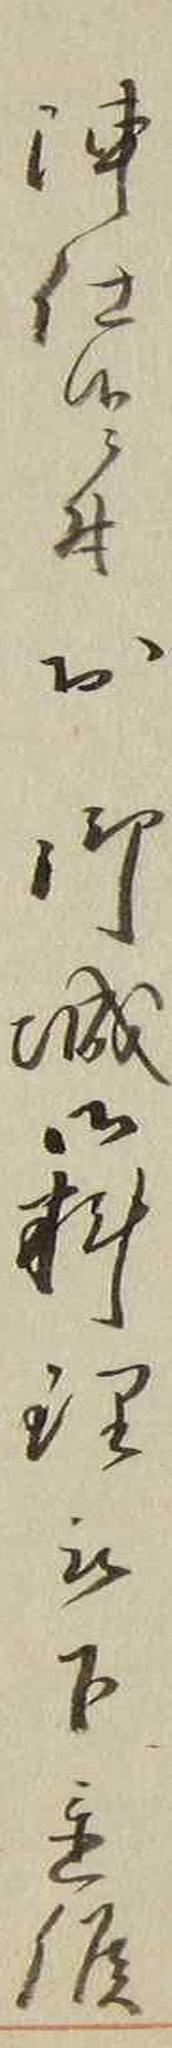陣仕候ニ付於御城御料理被下置候
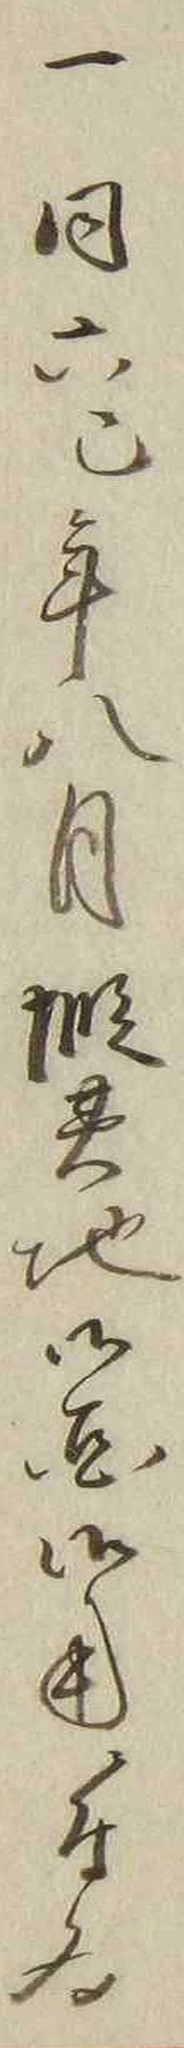一同六巳年八月蝦夷地御固御用付ニ付為

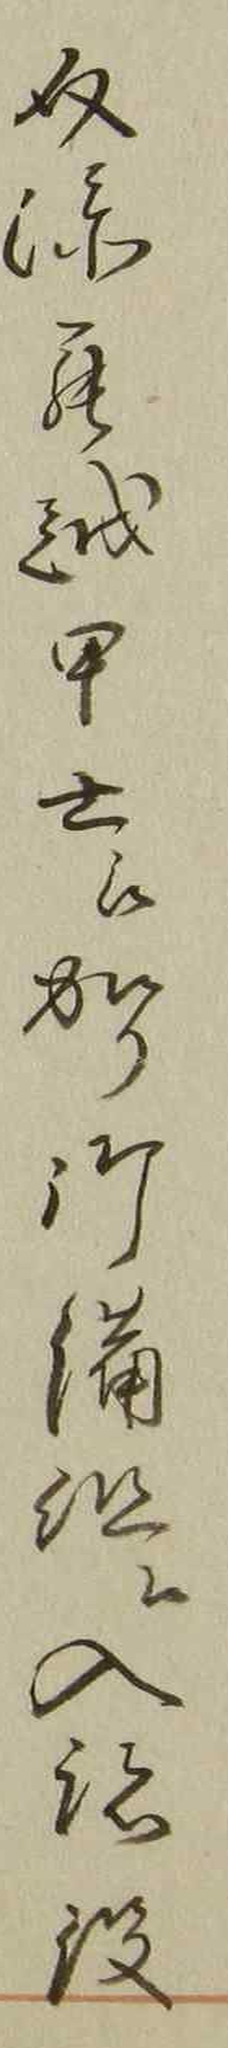介添罷越甲士江加り御備組江入諸役
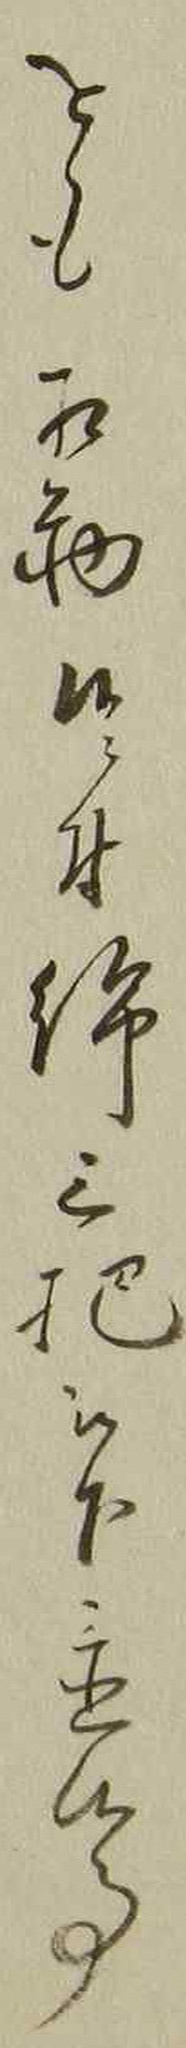をも相勤候ニ付綿三把被下置候事
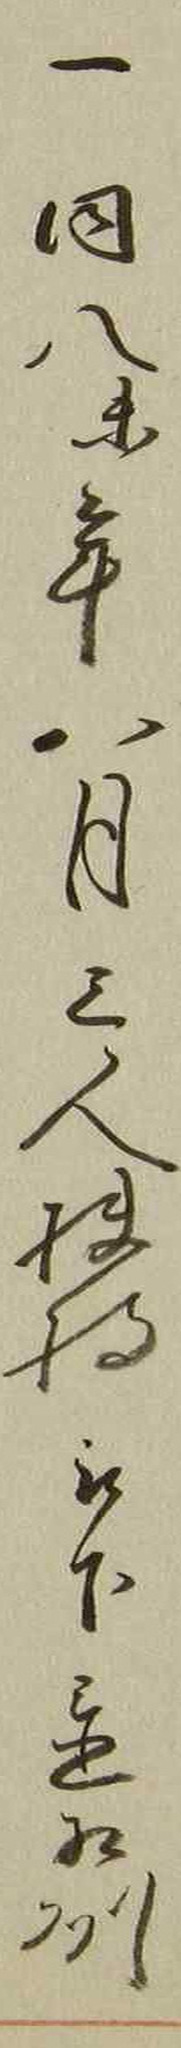一同八未年八月三人扶持被下置相州
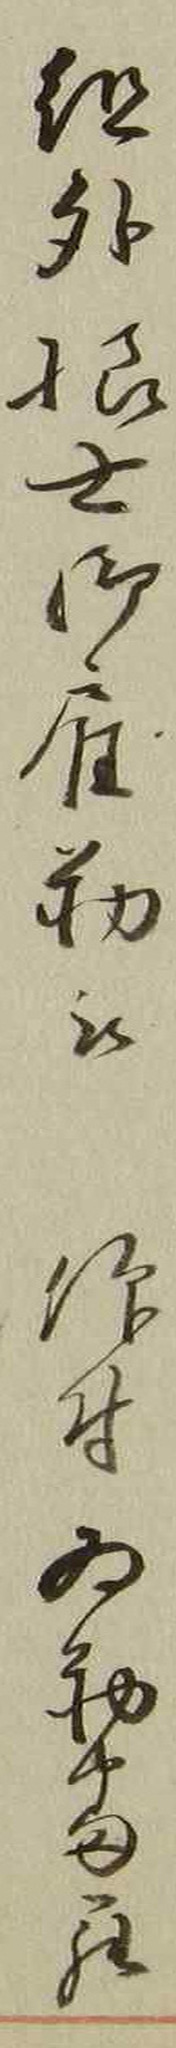組外様士御雇勤被仰付為勤番罷
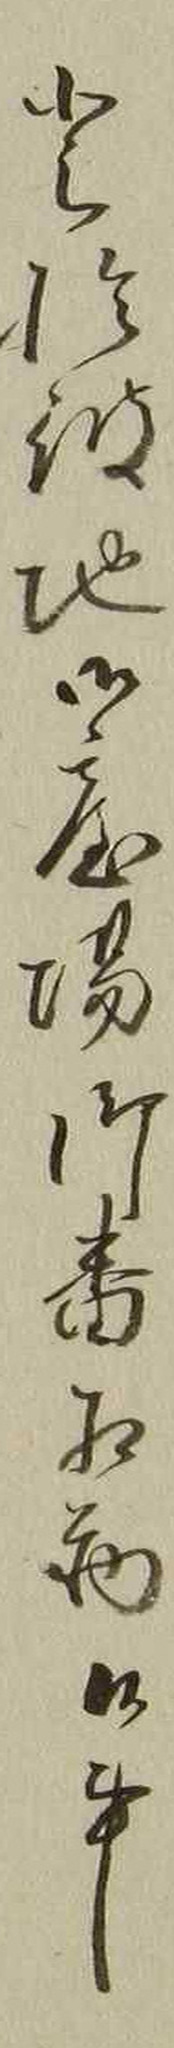登於彼地御台場御番相勤候事
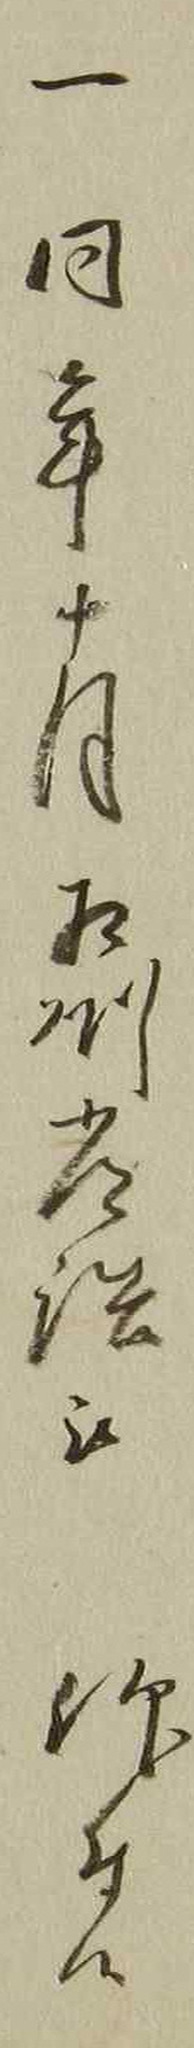一同年十月相州常詰被仰付候
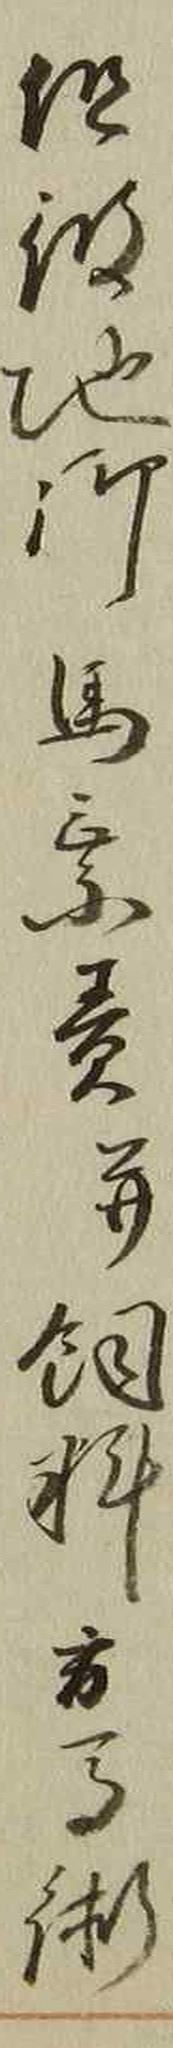但彼地御馬乗責并飼科方馬術
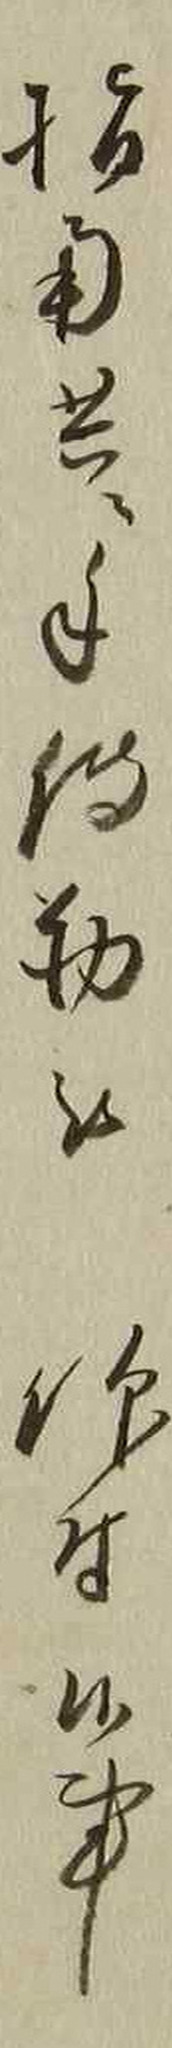指南共ニ手伝勤被仰付候事
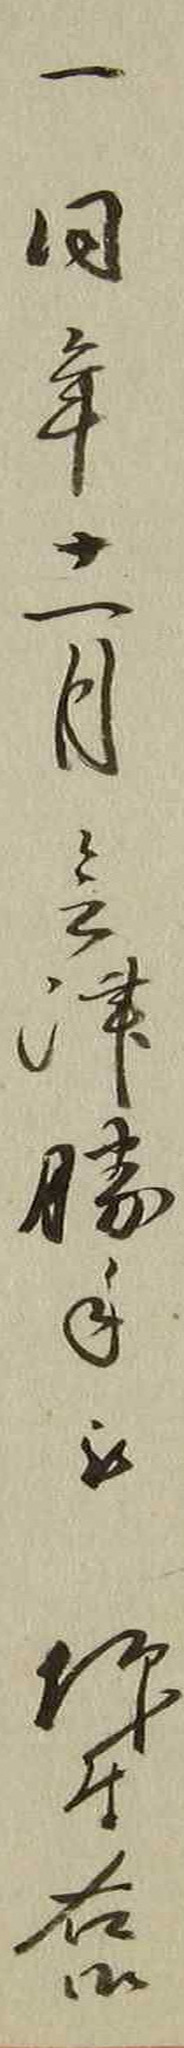一同年十一月会津勝手被仰付右御
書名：諸士系譜　巻之122　よ之部5
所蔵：会津若松市立会津図書館
